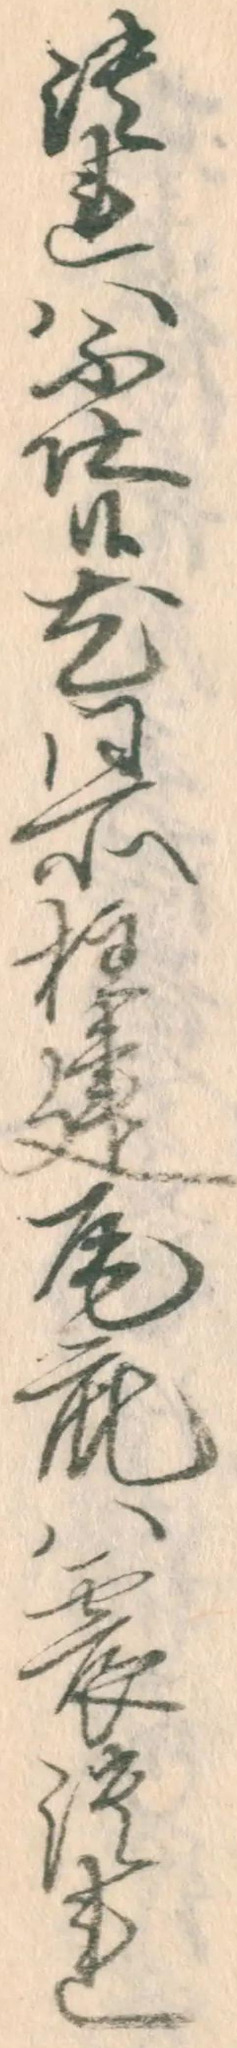潰れハ不仕候尤同所柱建瓦庇ハ震潰れ
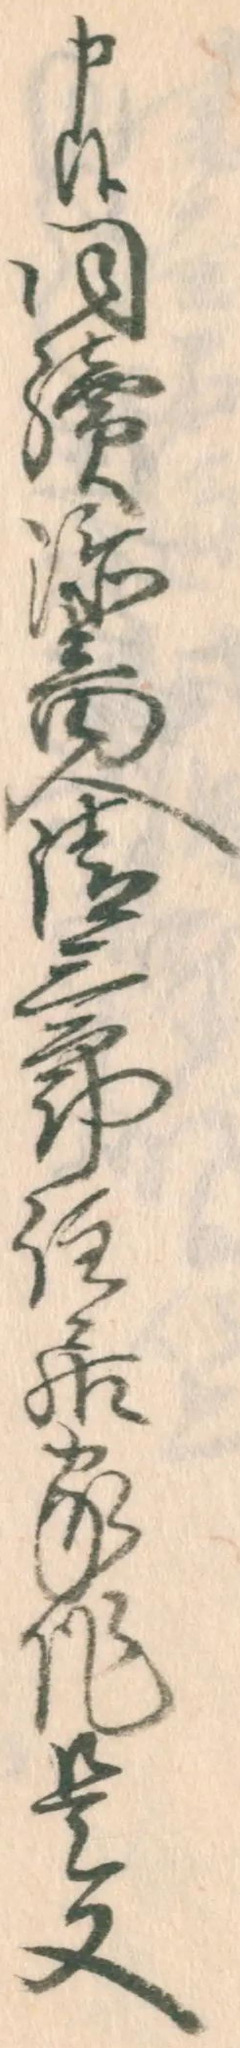申候同続添番人清三郎住居家作是又
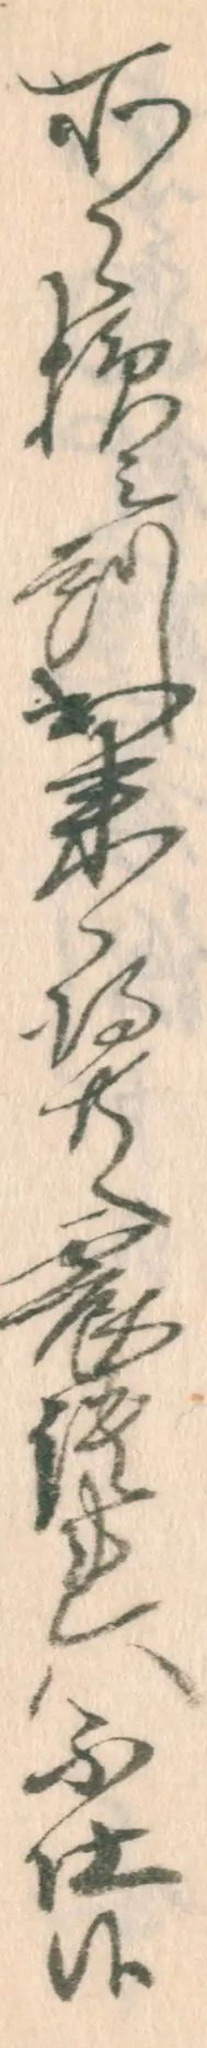所々損シ所出来候得共震潰れハ不仕候
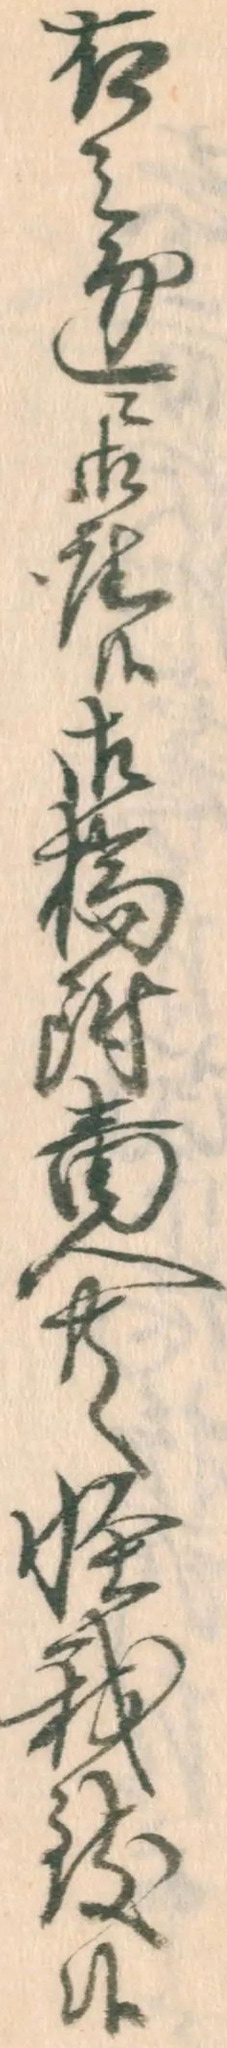右之通ニ御座候御橋附番人共怪我致候
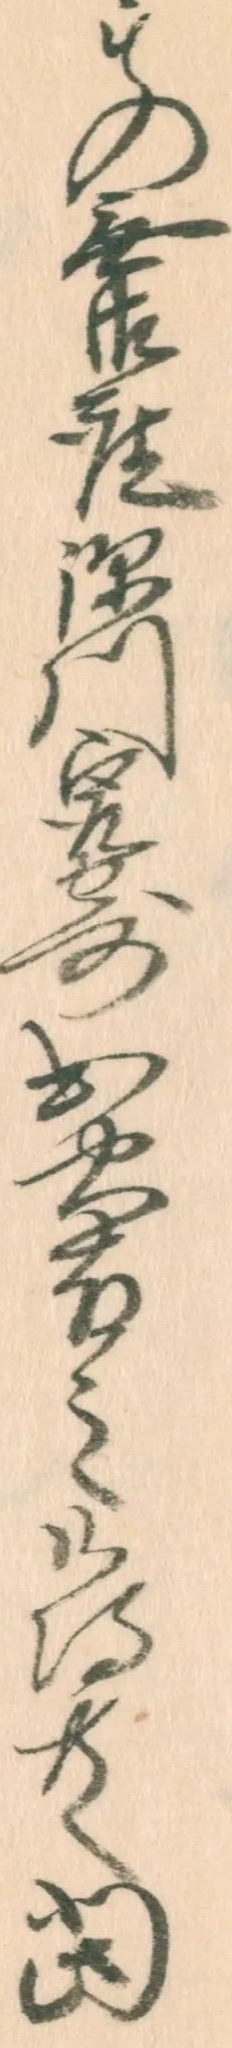もの無御座深川最寄出火有之候得共当
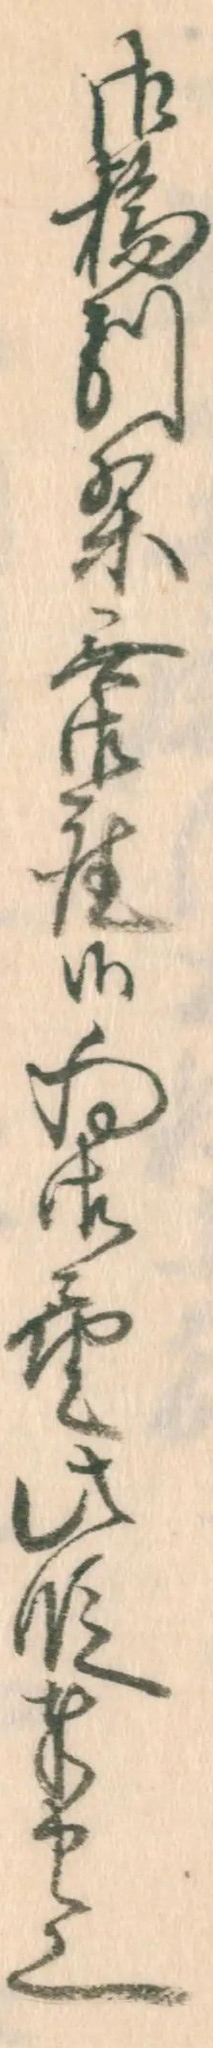御橋別条無御座候為御届此段奉申上
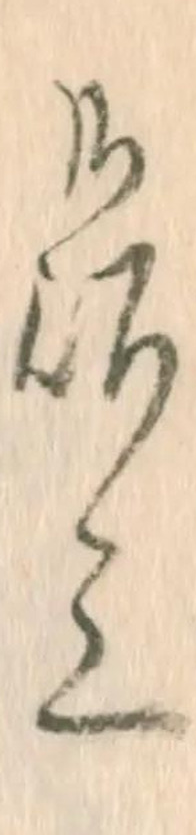候以上
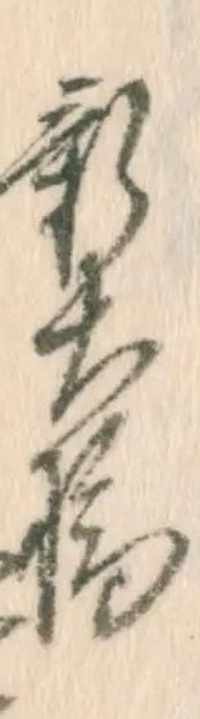新大橋
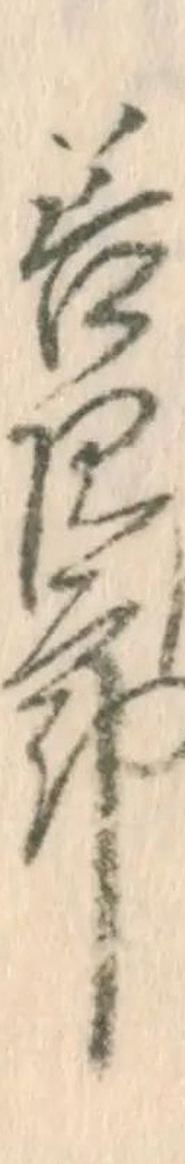善四郎
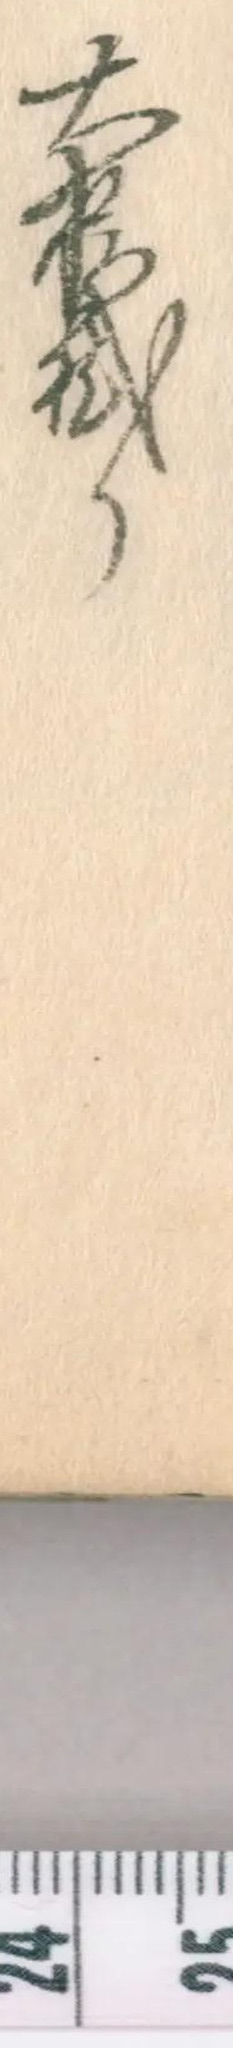右橋掛り

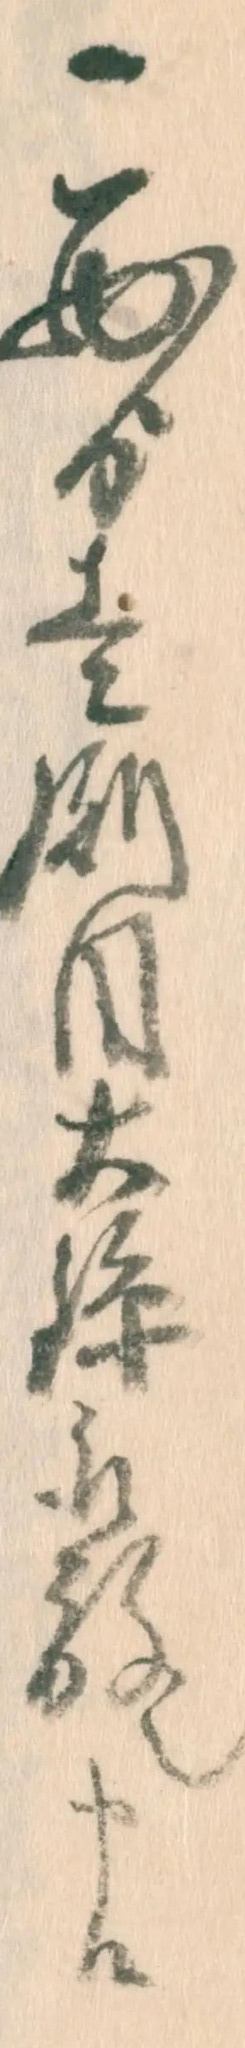一西ゟ壱側目大銯取放し申候
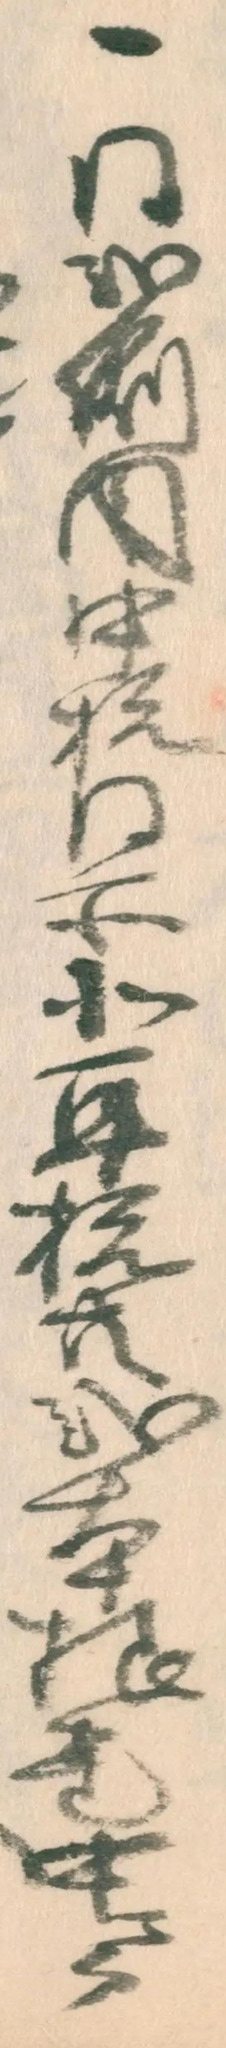一同弐側目中杭同所北耳杭共弐本根巻中ニ而
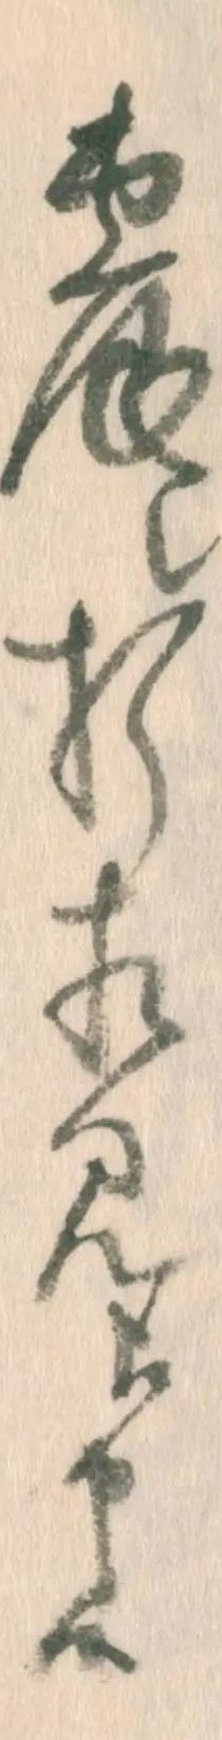震レ折相見え申候
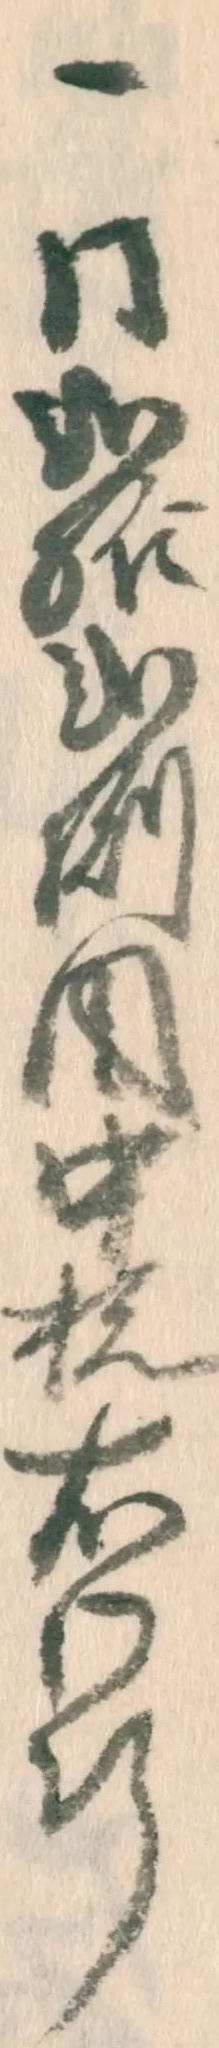一同弐拾弐側目中杭右同断
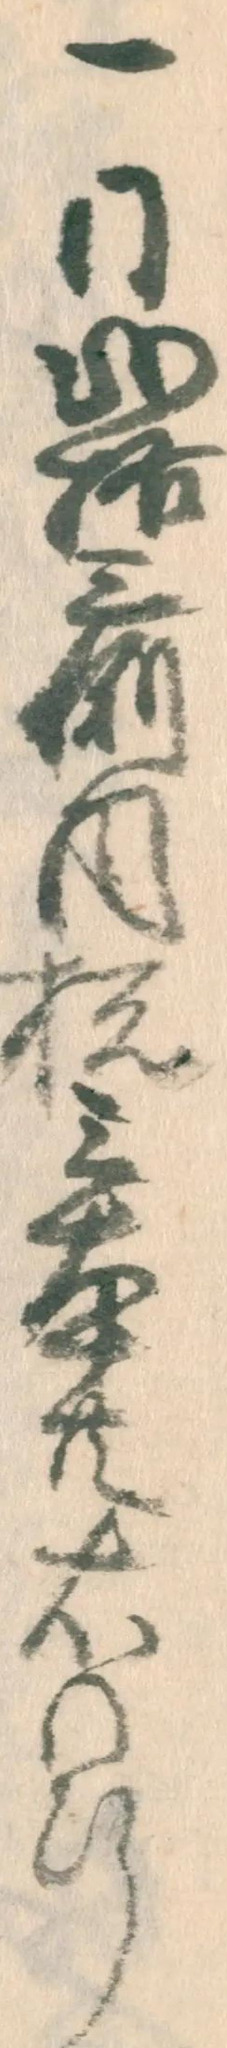一同弐拾三側目杭三本共右同断
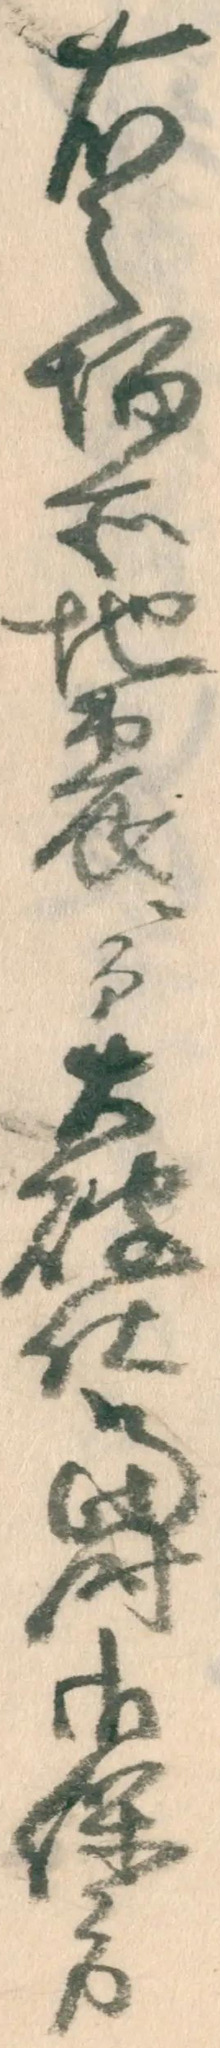右之場所地震ニ而大破仕当時御保方
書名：地震災書留 2巻. [1] 内表紙に「地震災書留　安政二卯年　但本所深川御用屋敷地代免除調」とあり
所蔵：国立国会図書館 National Diet Library, JAPAN
